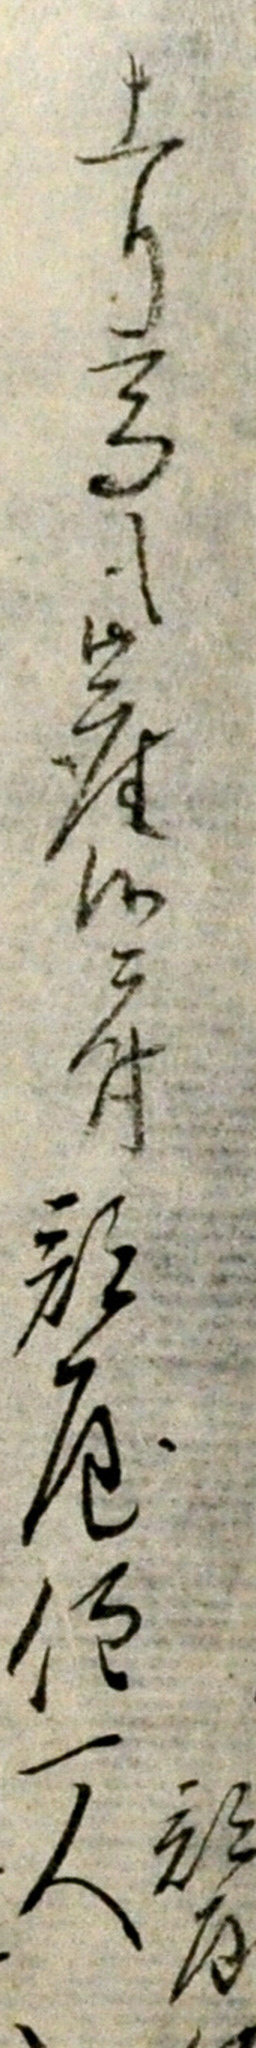上り高も御座候ニ付部屋住一人差加
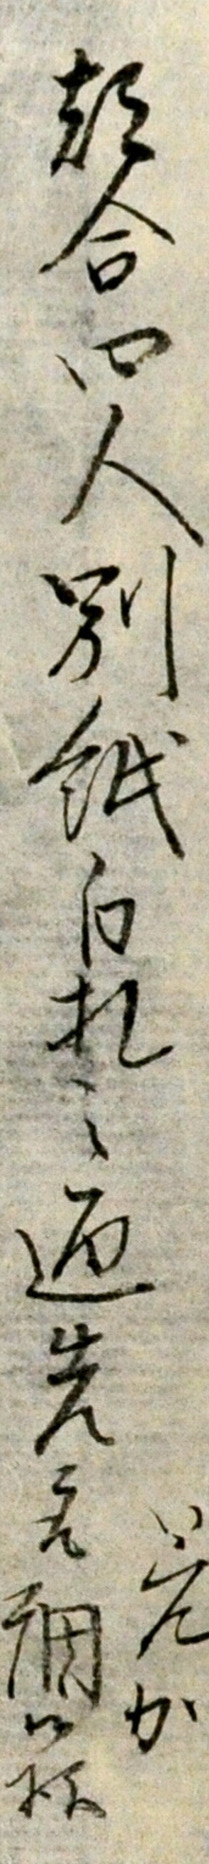都合四人別紙白札之通先取調候等様
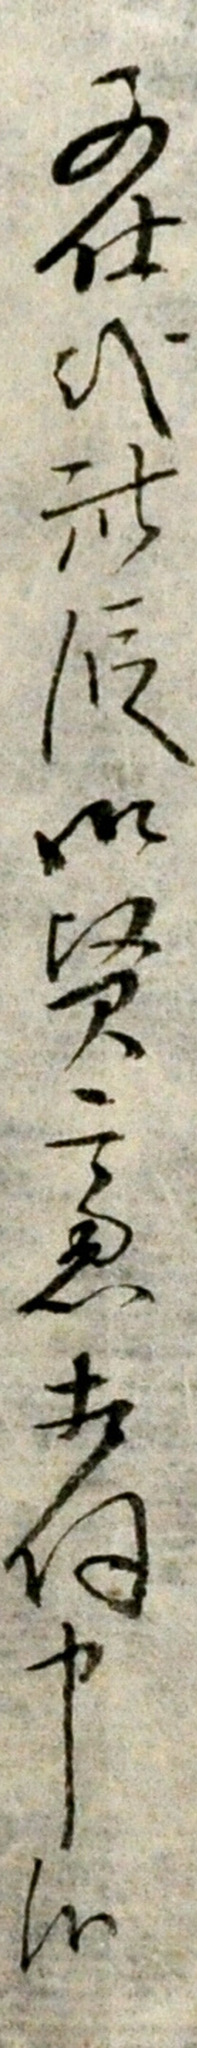可仕哉此段御賢慮相伺申候
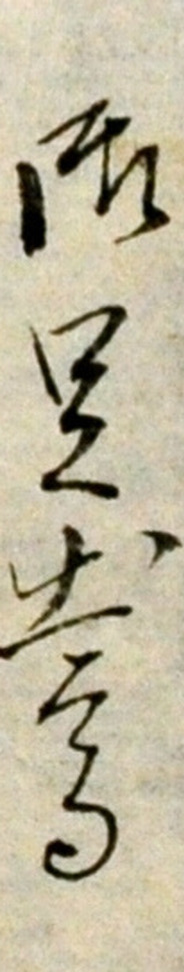御足出高
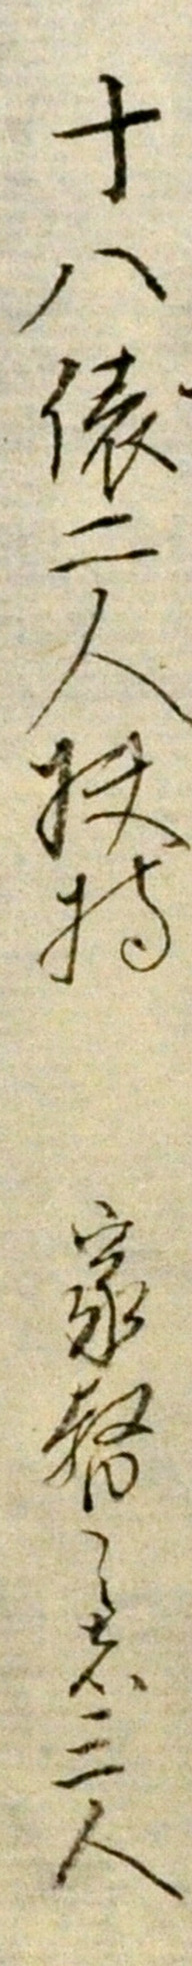十ハ俵二人扶持家督之者三人
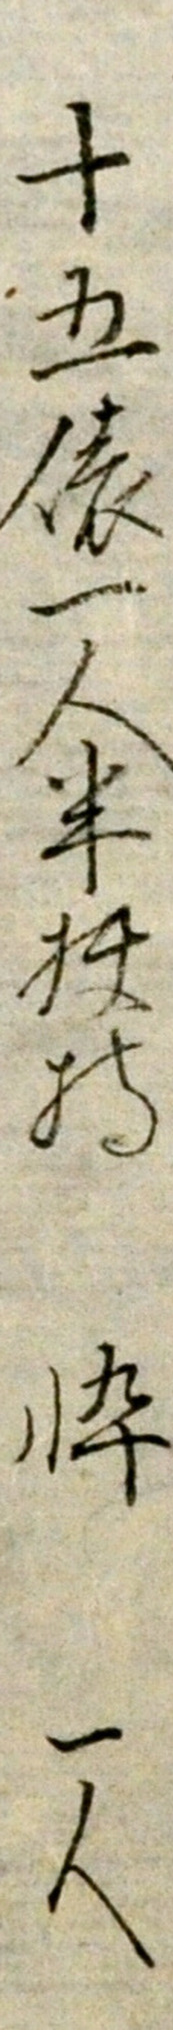十五俵一人半扶持忰一人
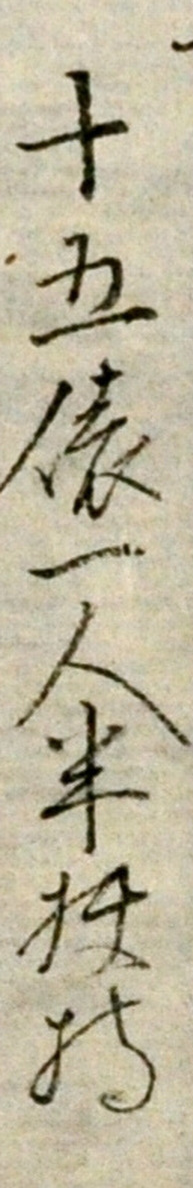八俵一人半扶持
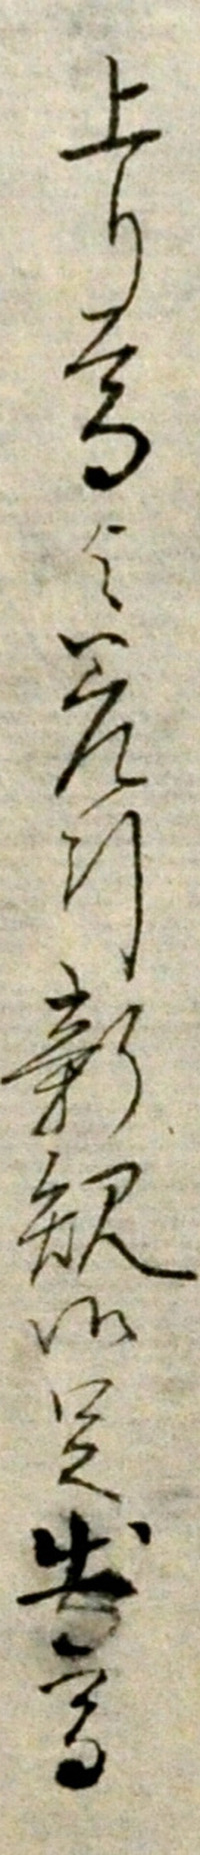上り高与差引新規御足出高
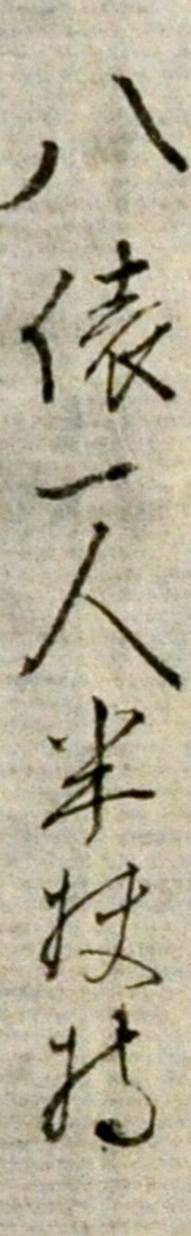八俵一人半扶持

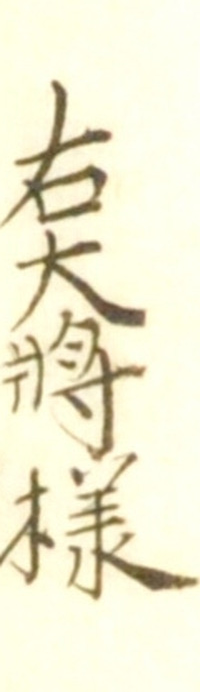右大将様

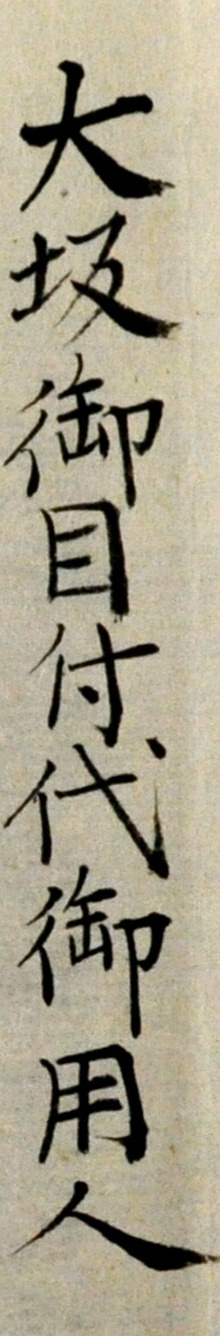大坂御目付代御用人
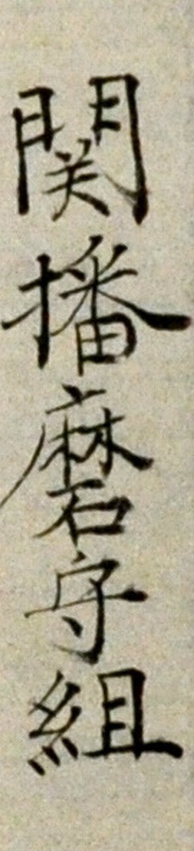関播磨守組
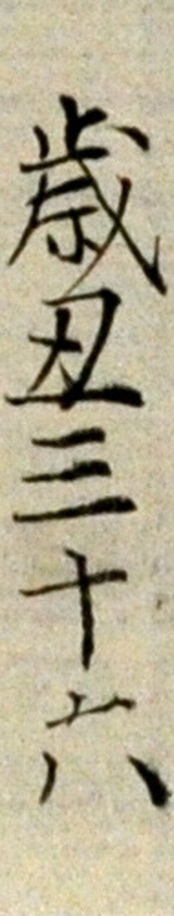歳丑三十六
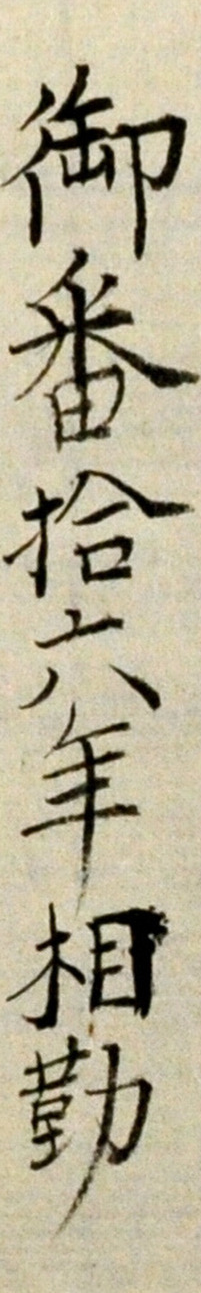御番拾六年相勤

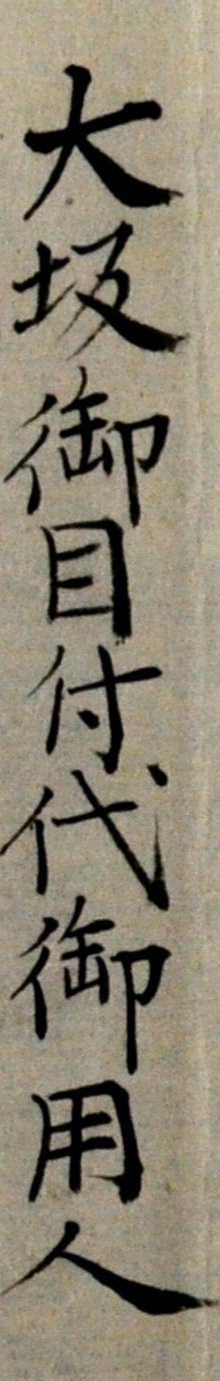大坂御目付代御用人
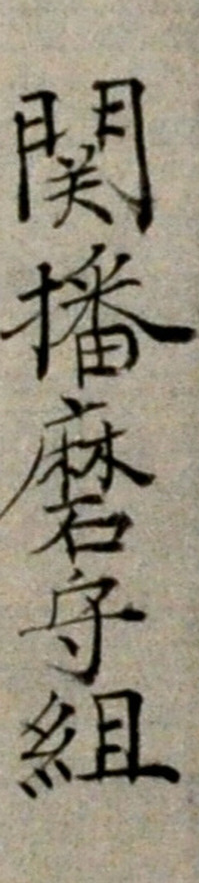関播磨守組
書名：若年寄御役中御調書付
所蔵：伊那市立高遠町図書館・合同会社AMANE
